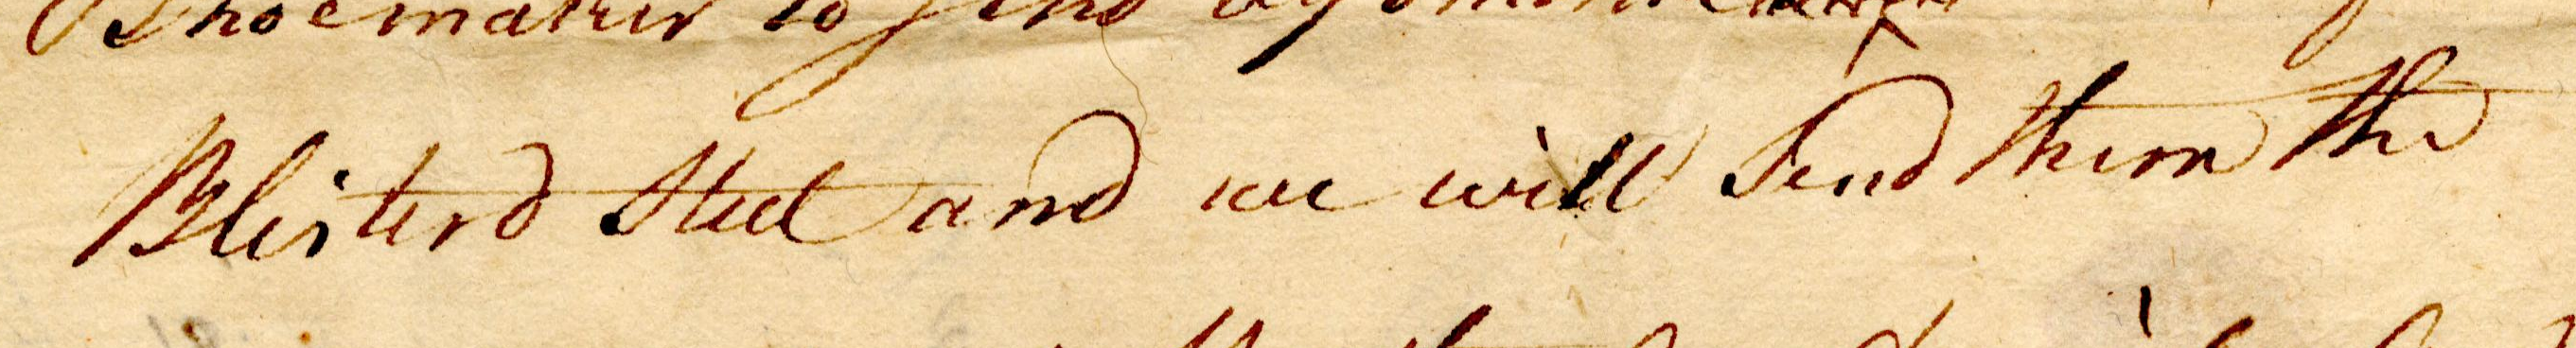Blisterd Steel and we will Send them the
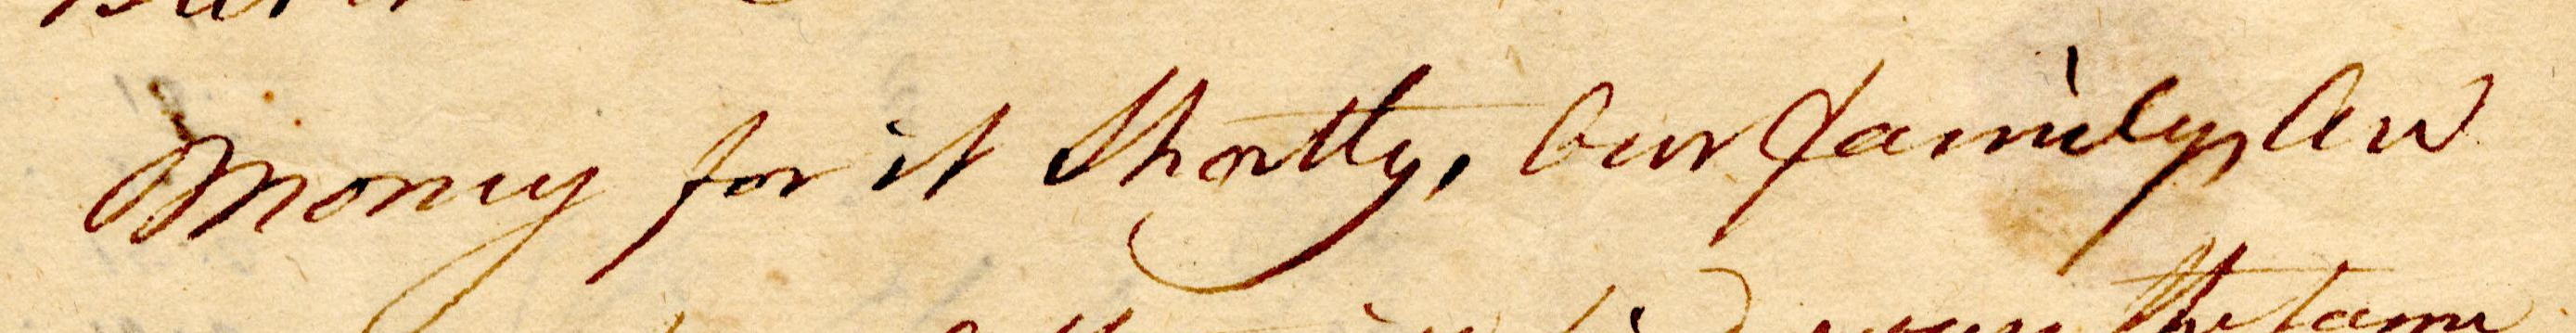Money for it Shortly, our family are
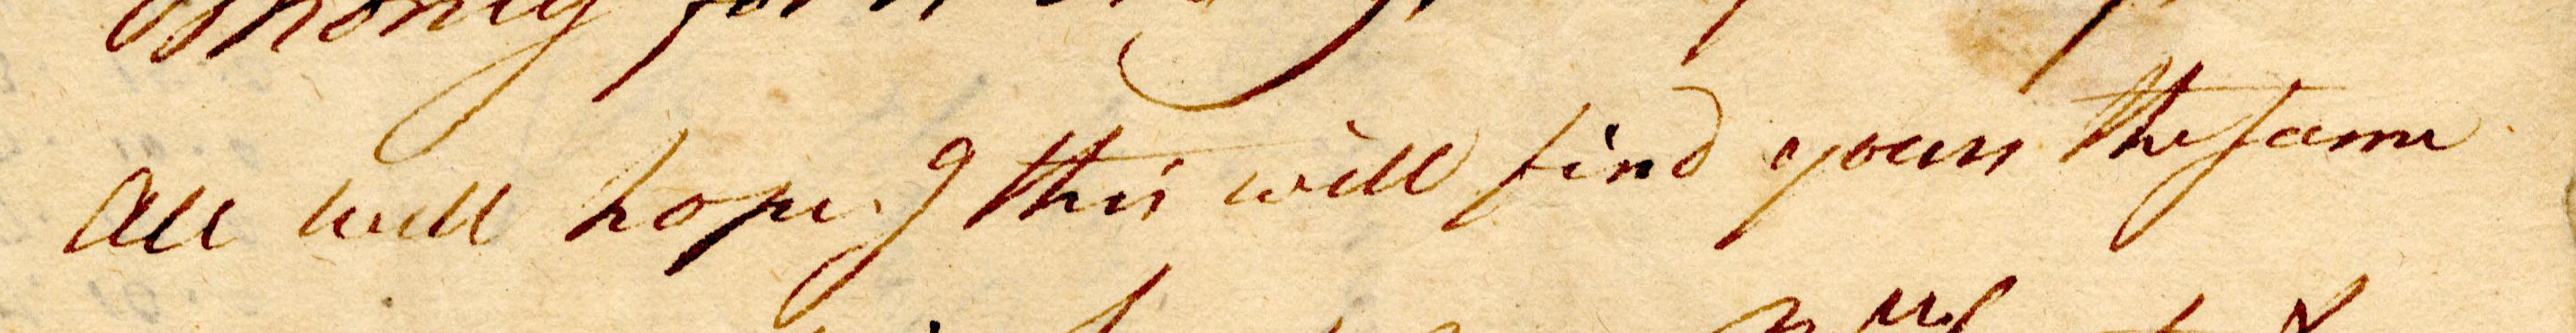all well hope^g. this will find yours the same
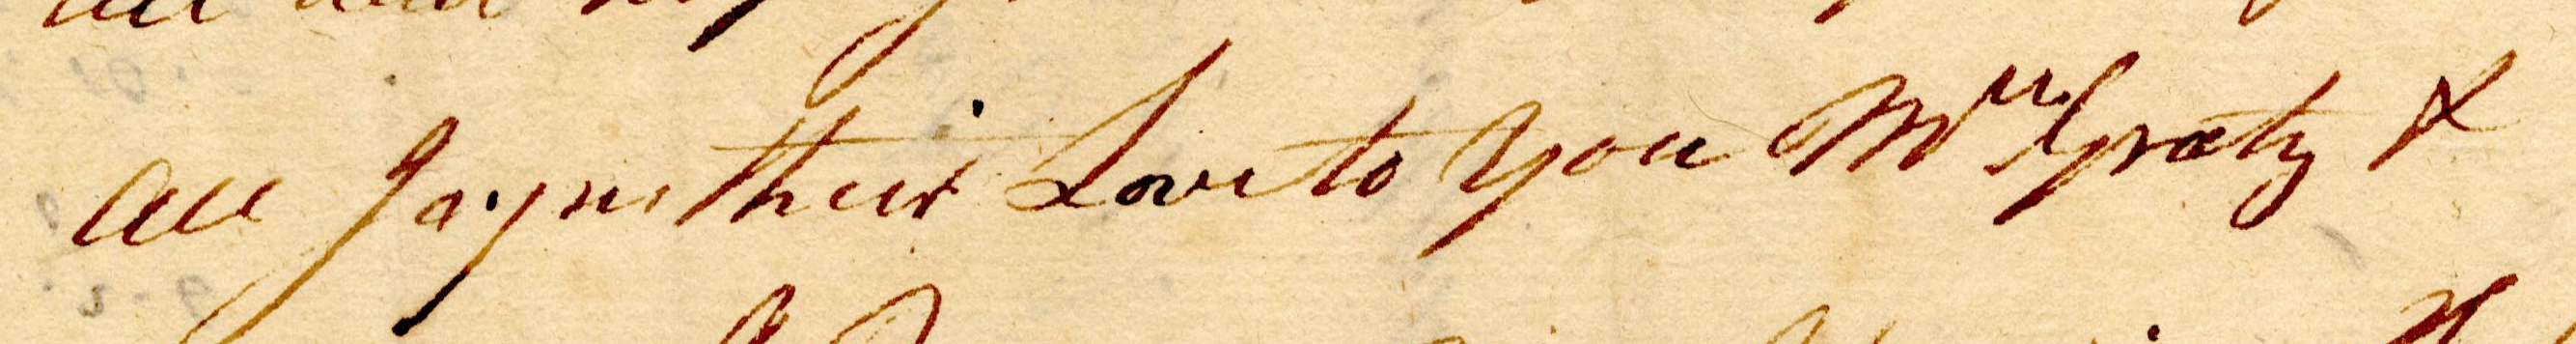All Joyns their Love to You M^rs Gratz &
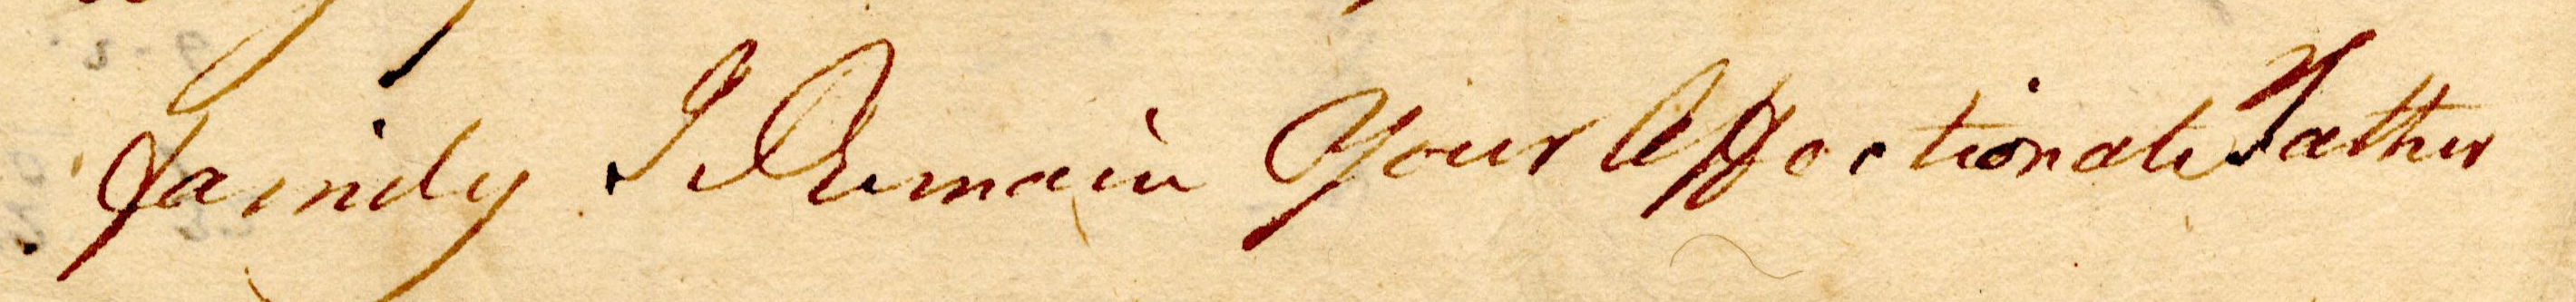family I remain Your Affectionate Father
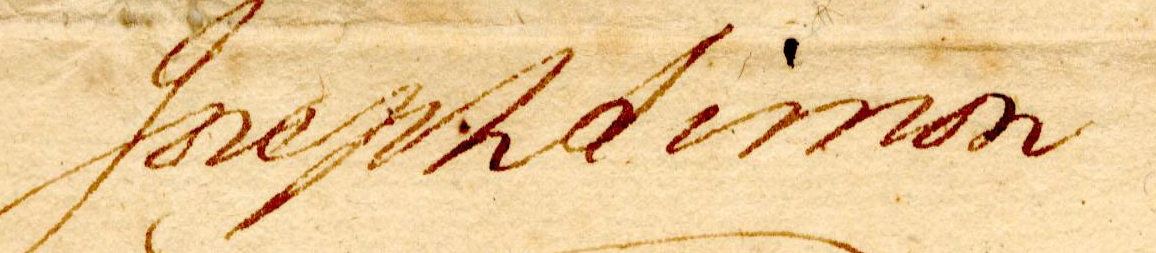Joseph Simon
